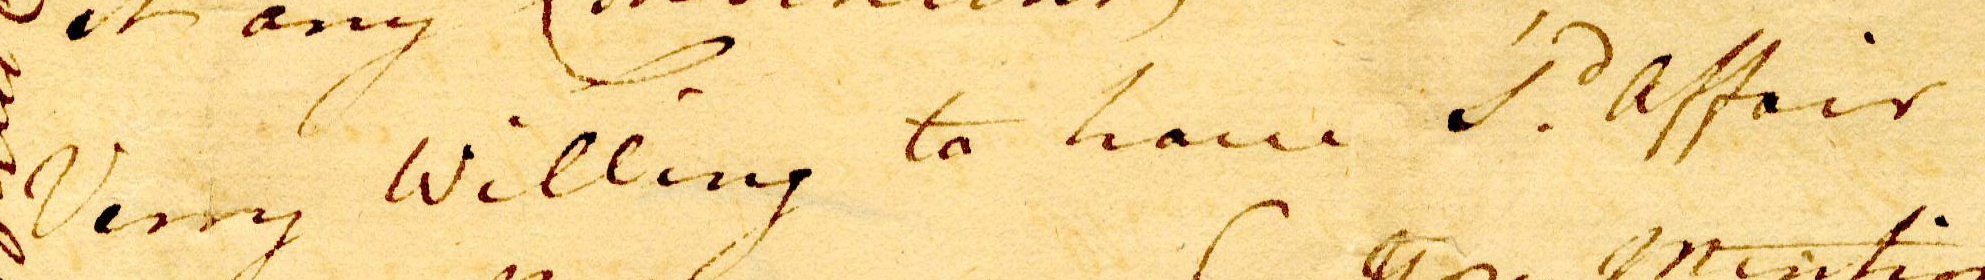Very Willing to have s^d. Affair
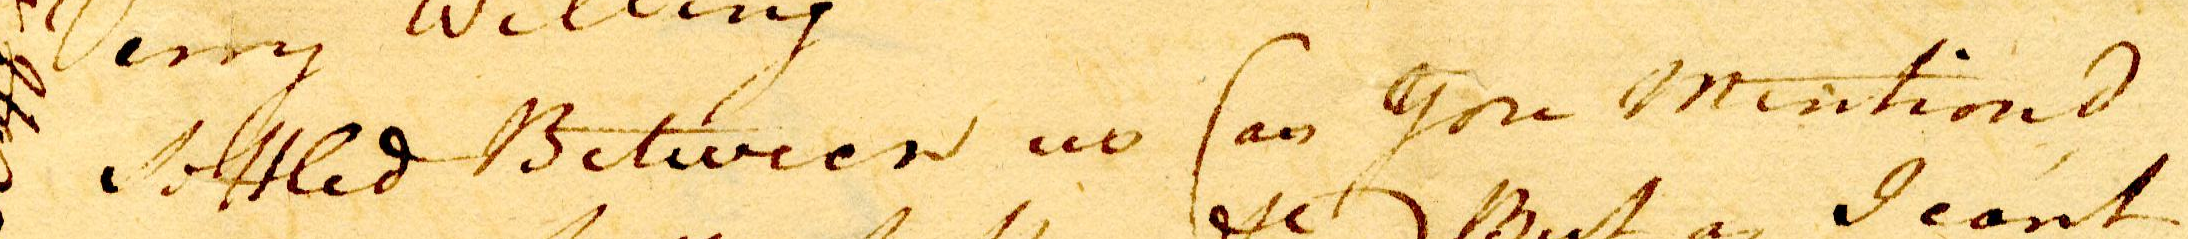settled Between us (as you mentiond
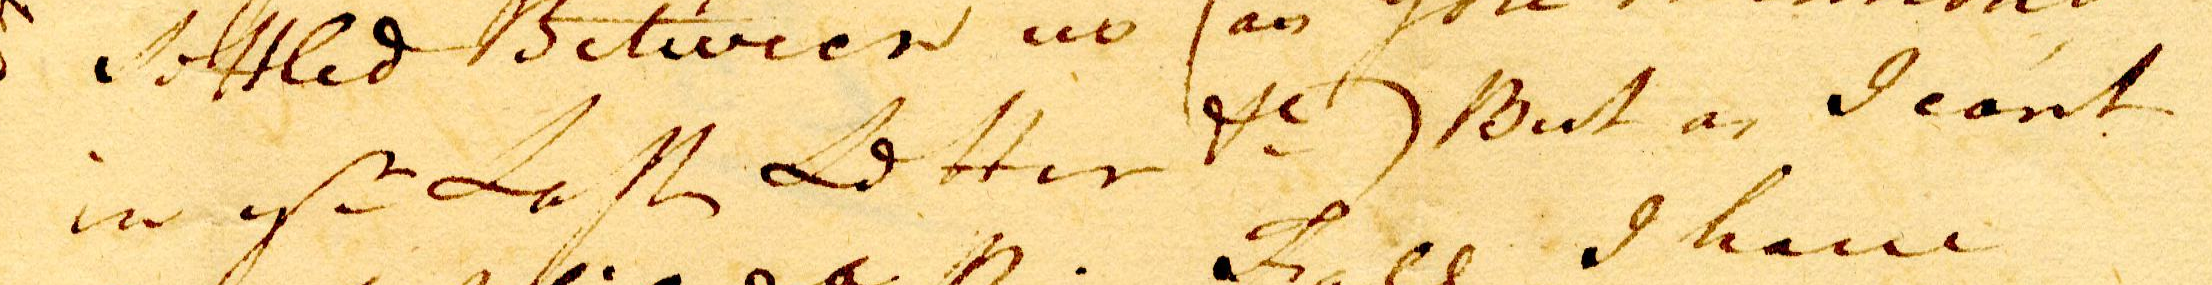in y^r Last Letter &^c.) But as I cant
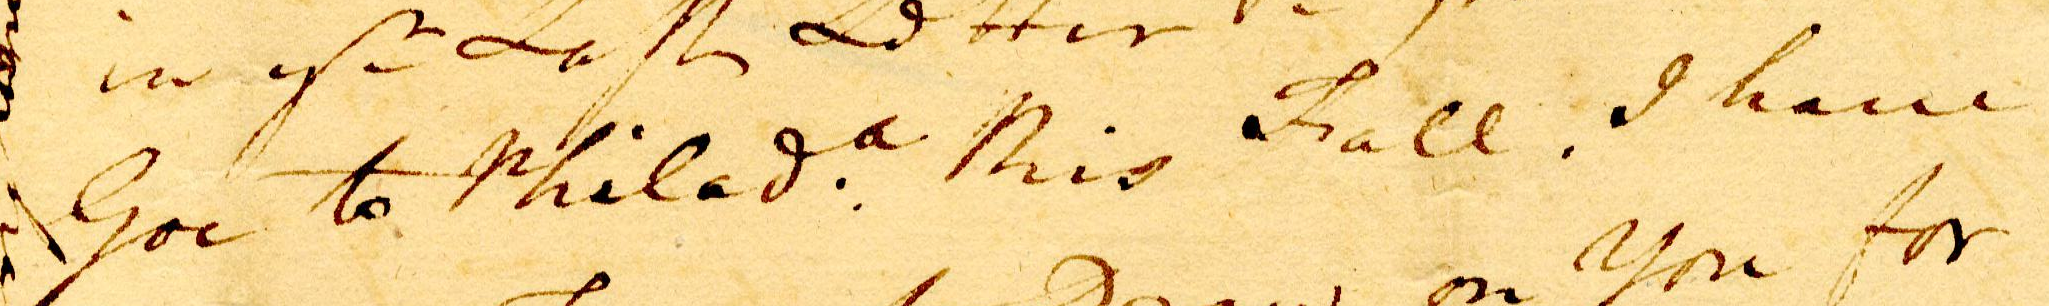Goe to Philad^a. this Fall, I have
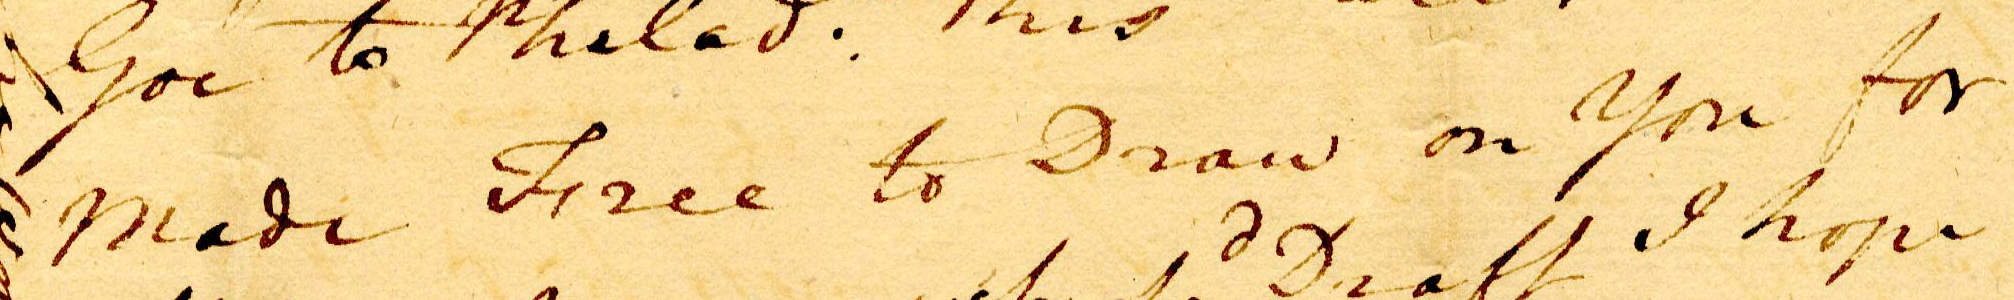made Free to Draw on you for
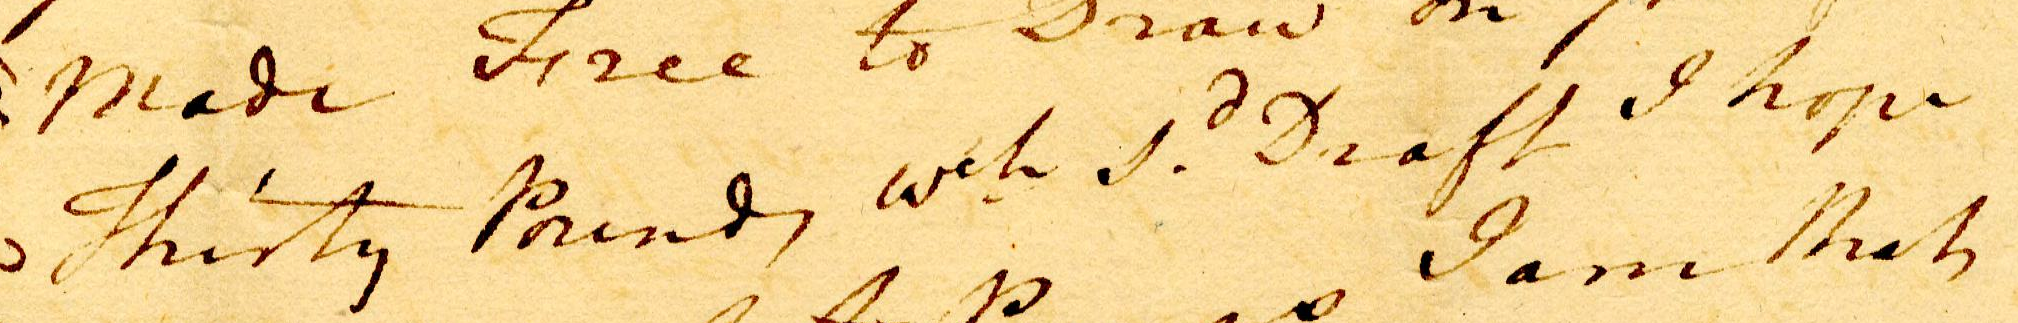Thirty Pounds w^ch. s^d. Draft I hope
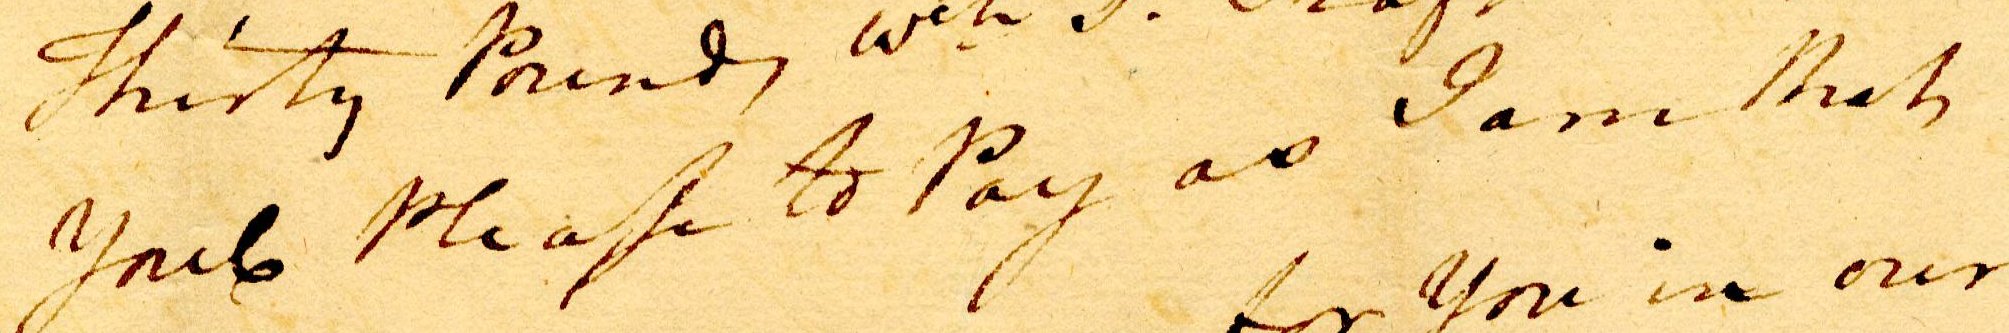Youl please to Pay as I am that
